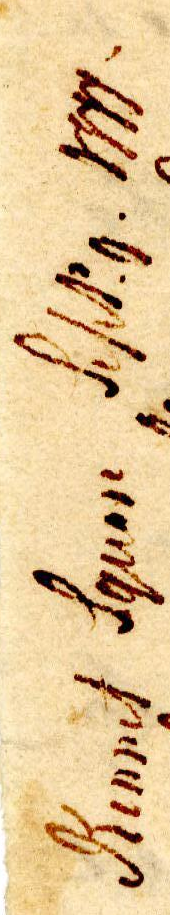Kennet Square Sep^r. 9 1777.
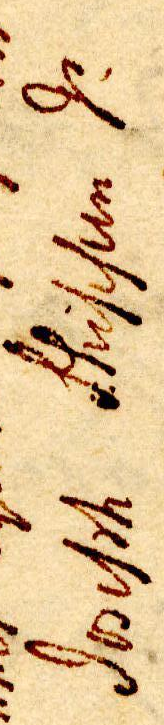Joseph Shippen J^r.
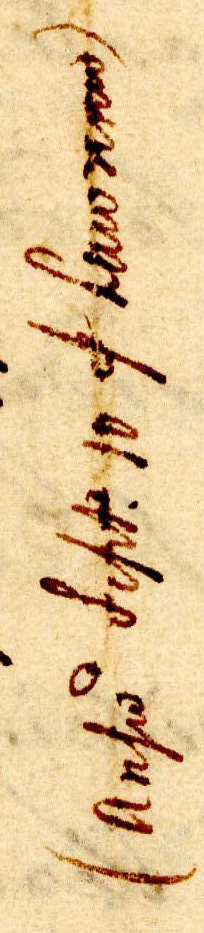(answ^d Sept. 10 per Lawrence)
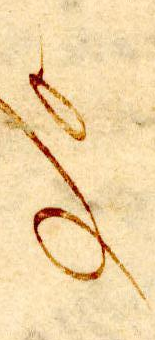To
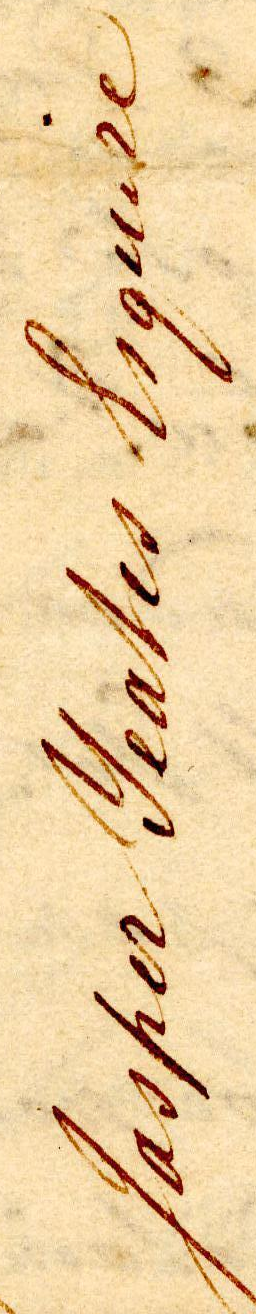Jasper Yeates Esquire
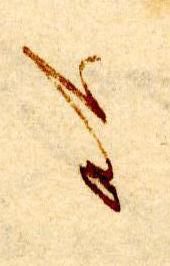at
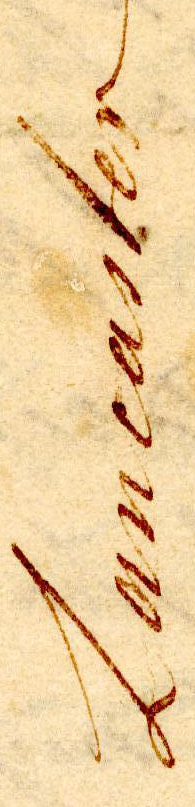Lancaster
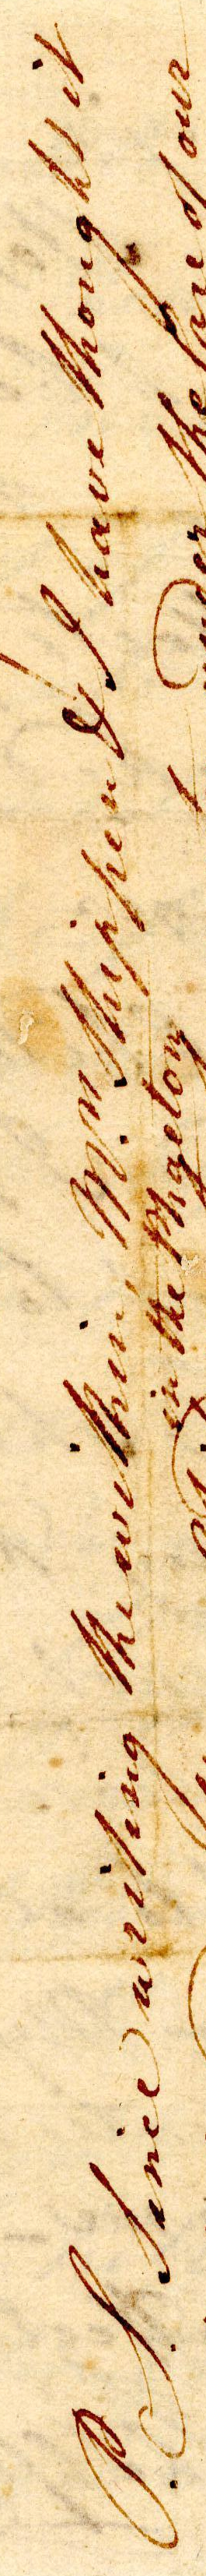P.S. Since writing the within, M^rs. Shippen & I have thought it
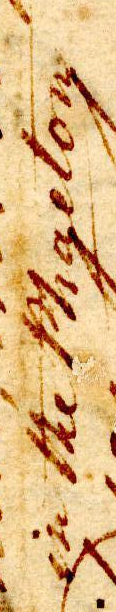in the Phaeton
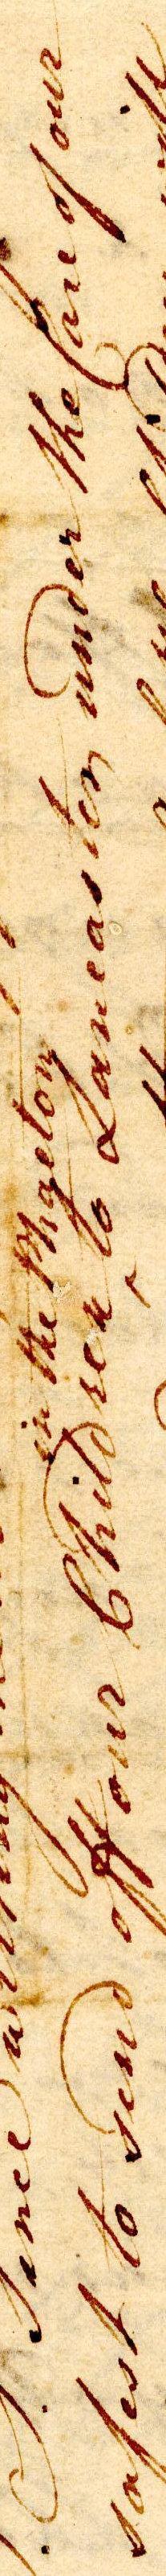safest to send off our Children ^ to Lancaster under the Care of our
